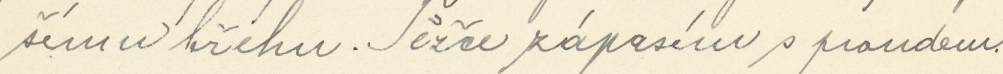šímu břehu. Těžce zápasím s proudem.
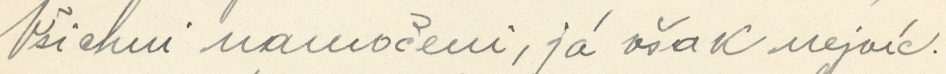Všichni namočeni, já však nejvíc.
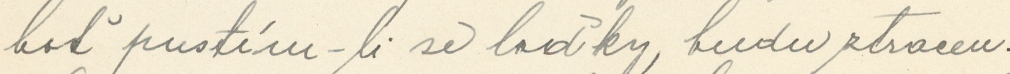boť pustím-li se loďky, budu ztracen.
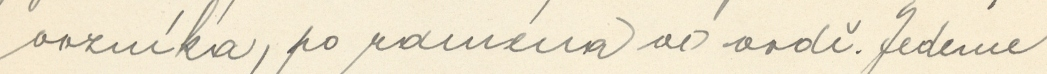vozníka, po ramena ve vodě. Jedeme
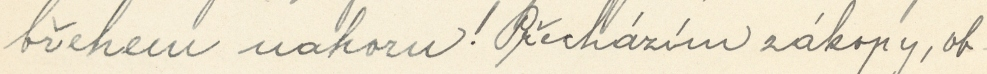břehem nahoru! Přecházím zákopy, ob-
